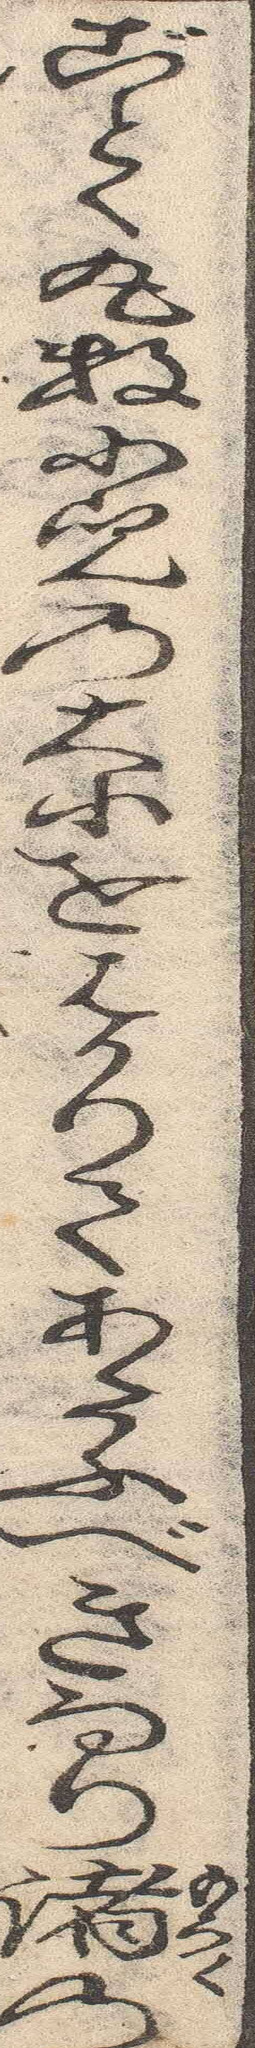ごとく丸数小児の大小をはかりてあたふべきなり諸の
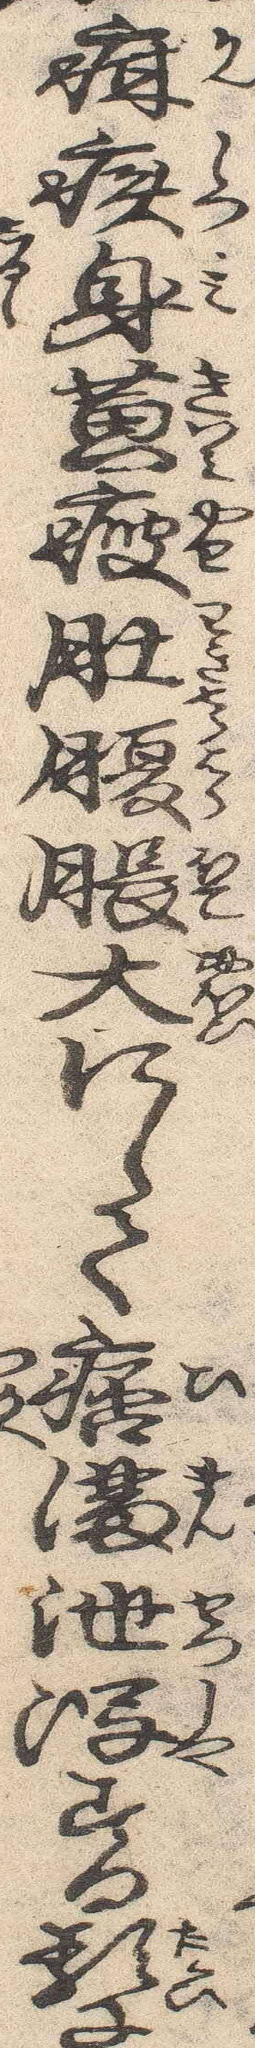疳疾身黄痩肚腹脹大にして痞満泄瀉する類に
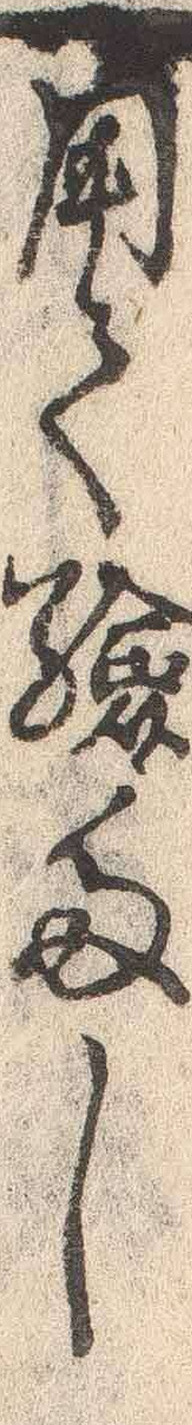用て験多し
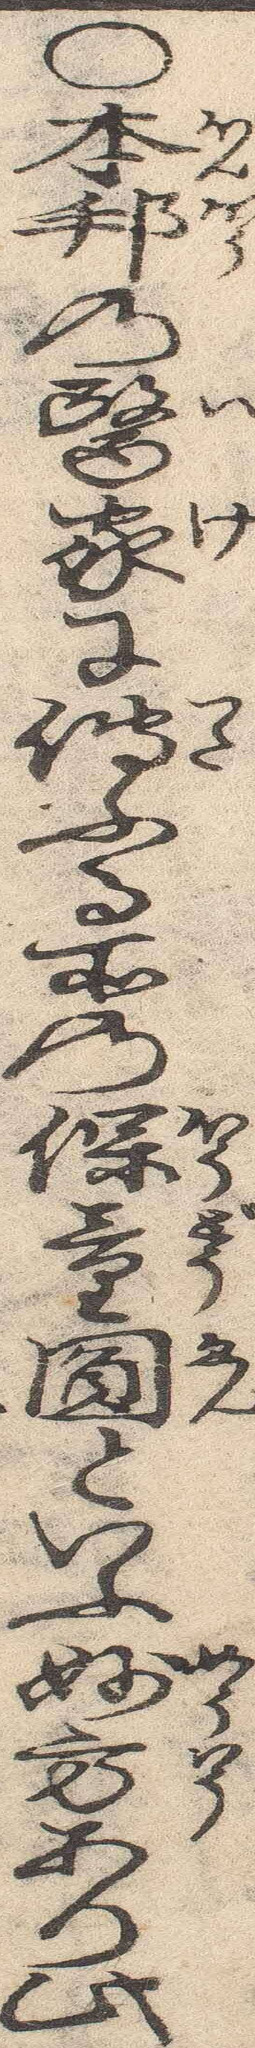○本邦の医家に伝ふる所の保童円といふ妙方あり此
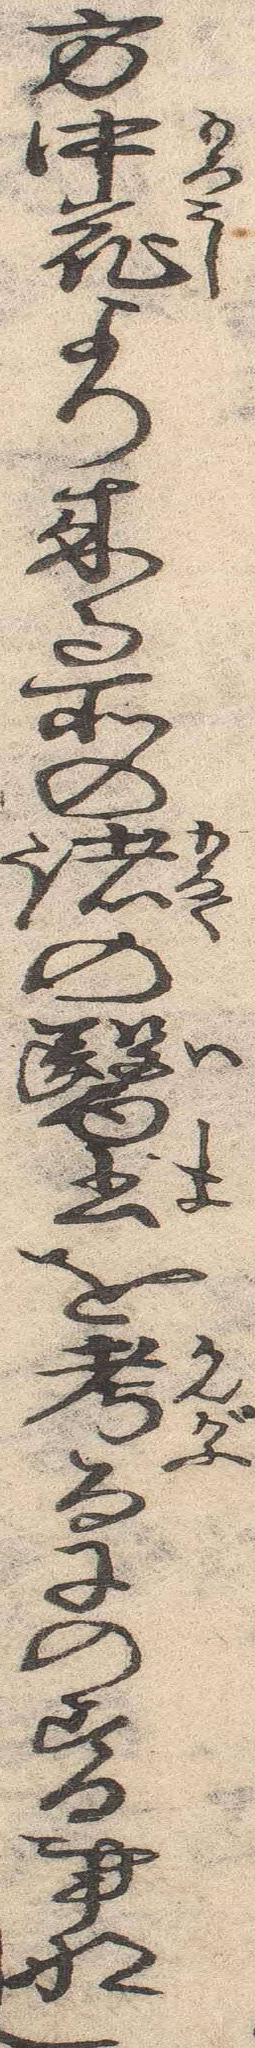方中花より来る所の諸の医書を考るにのする事なし
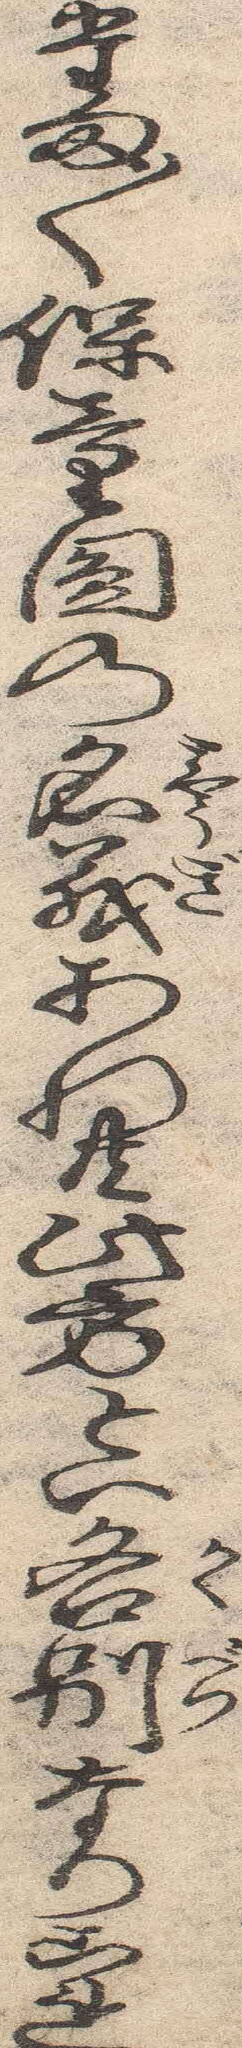たま〳〵保童円の名義あれ共此方とは各別なりこれ
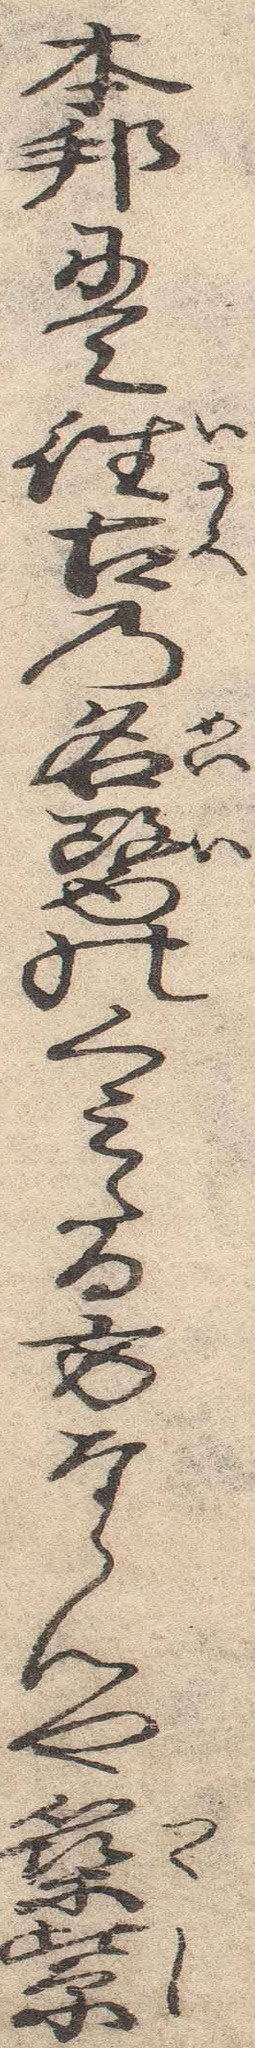本邦にて往古の名医のくみたる方ならんや筑紫
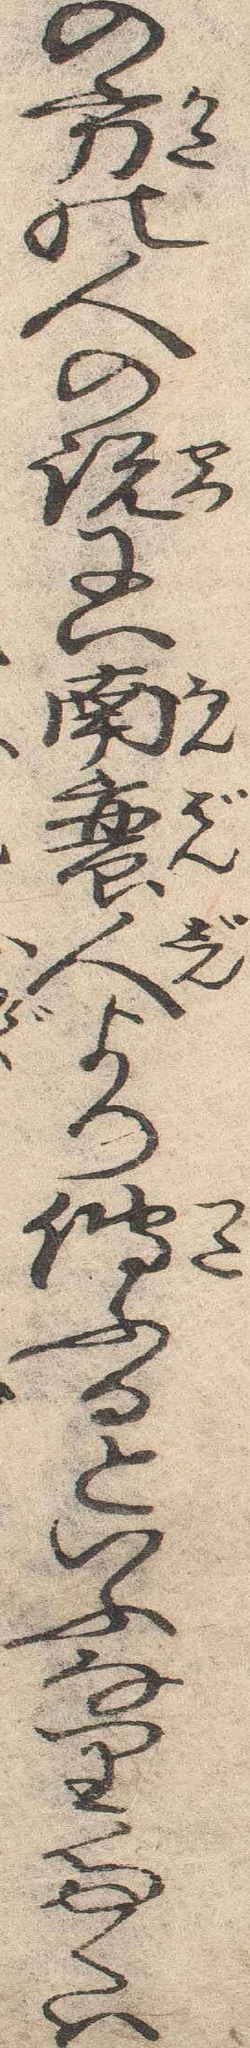の方の人の説には南蛮人より伝ふるといふなり多くは
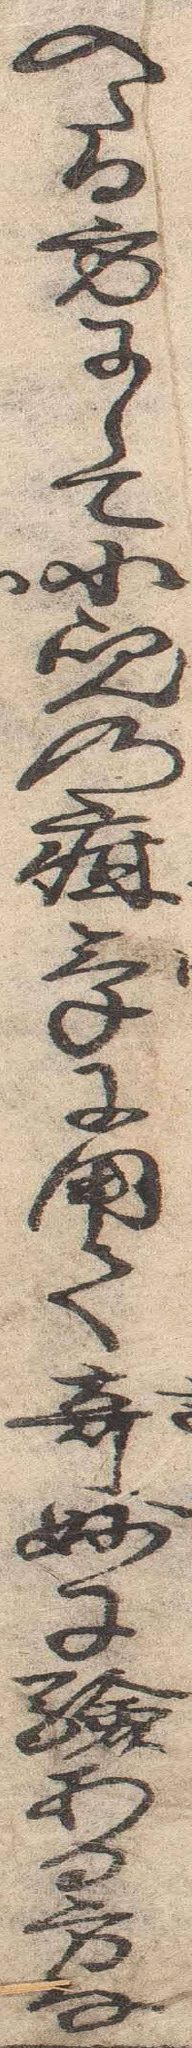入たる方にして小児の疳気に用て奇妙に験ある方な
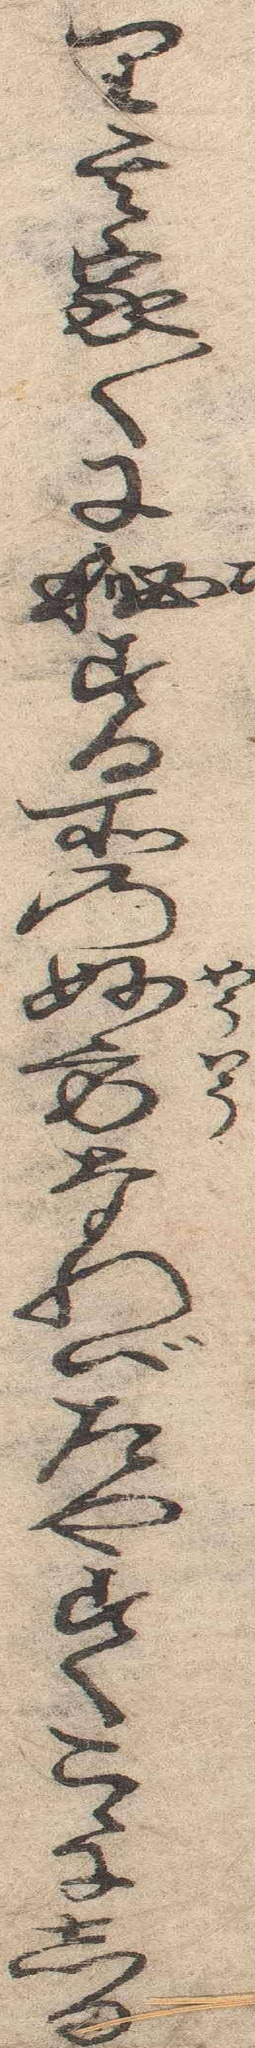り其家〳〵に秘する所の妙方なればたやすくこゝにしる

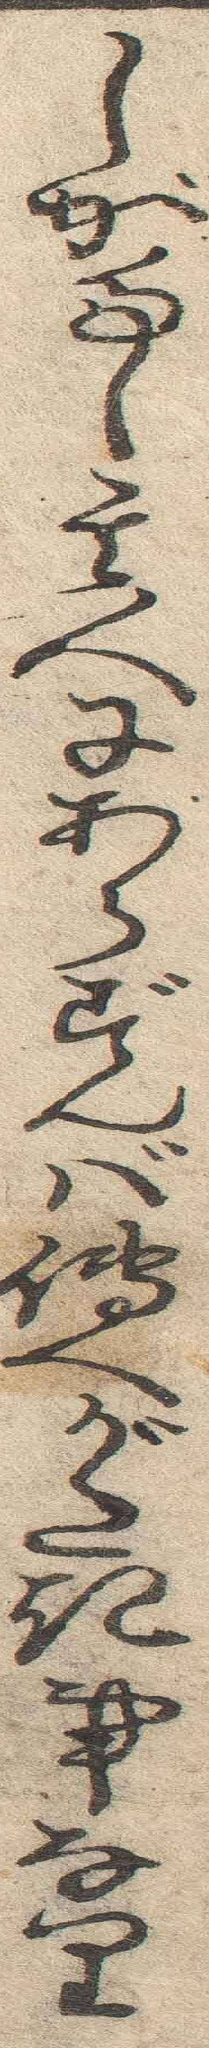しが多し其人にあらずんば伝へがたき事なり
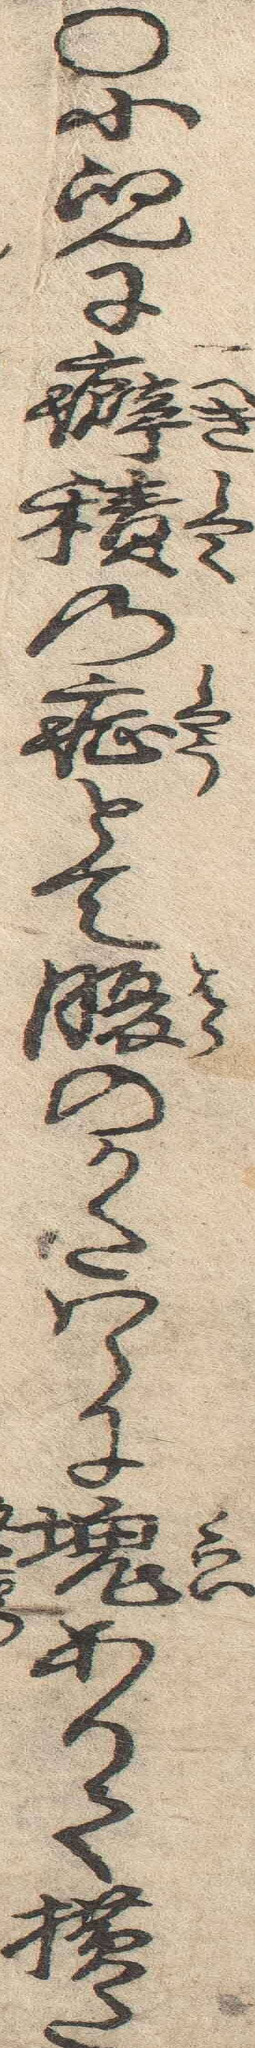○小児に癖積の症とて腹のかたわらに塊ありて横た
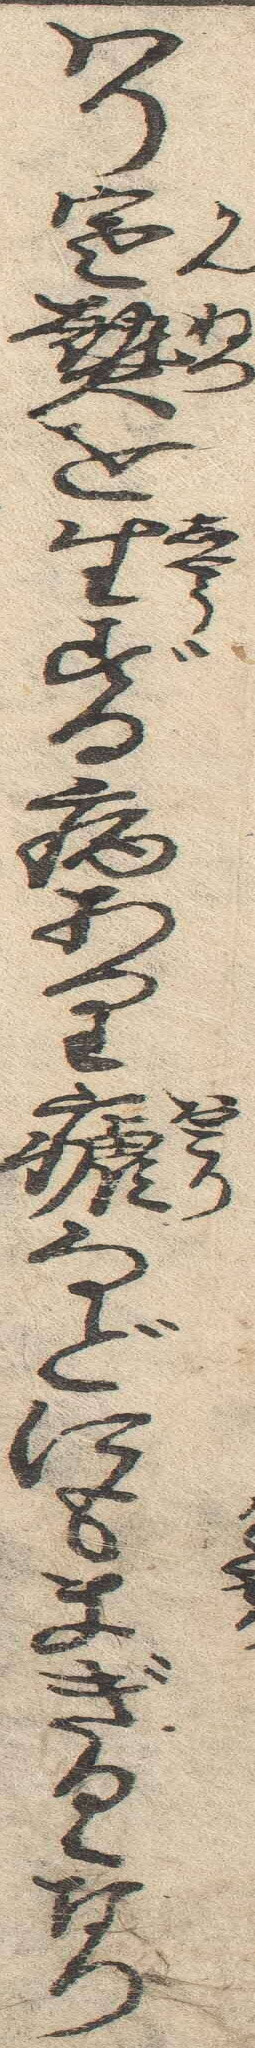わり寒熱を生ずる病あり瘧などにもまぎるゝなり
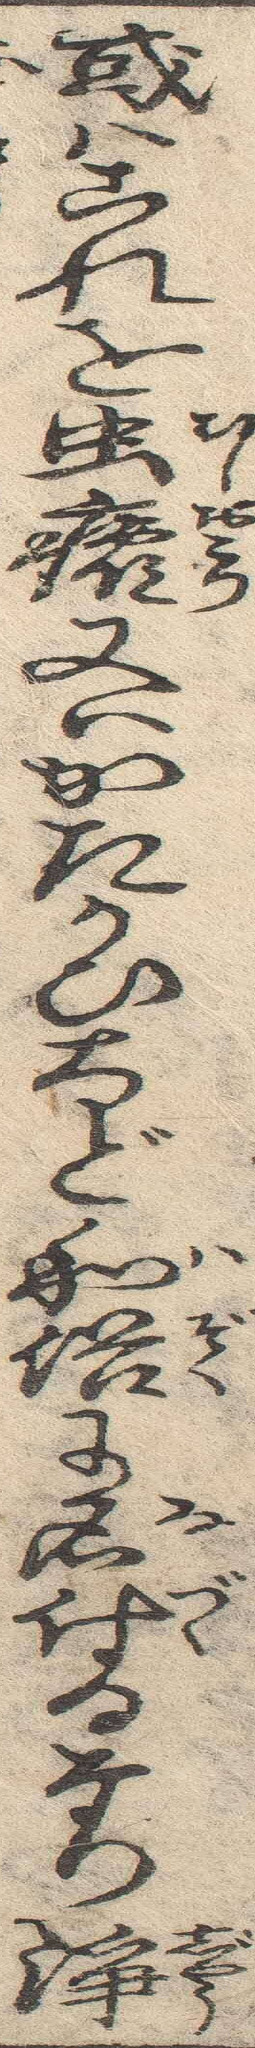或はこれを虫瘧又はかたかひなど和俗に名付るなり浄
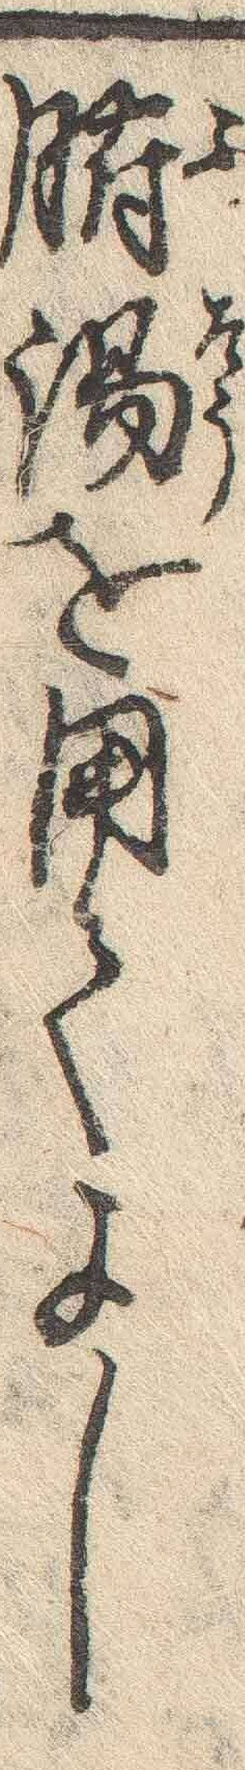腑湯を用てよし
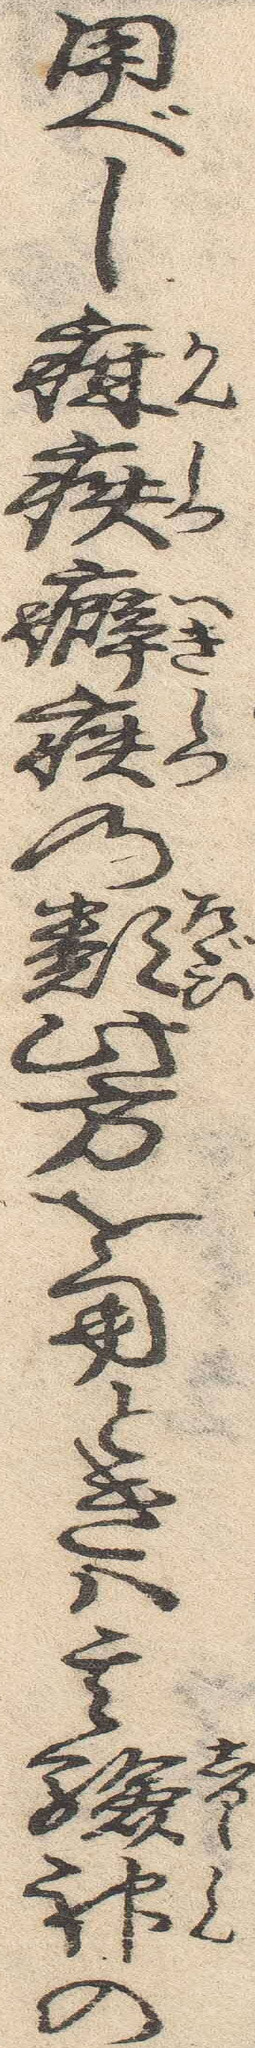用べし疳疾癖疾の類此方を用ときは其験神の
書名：小児必用養育草
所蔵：東京学芸大学附属図書館 国文学研究資料館
